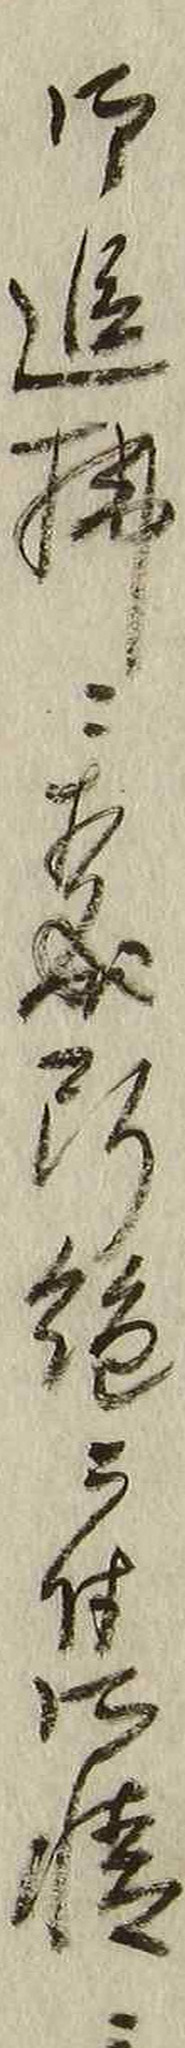御追払ニ相成断絶ニ付御情ニ
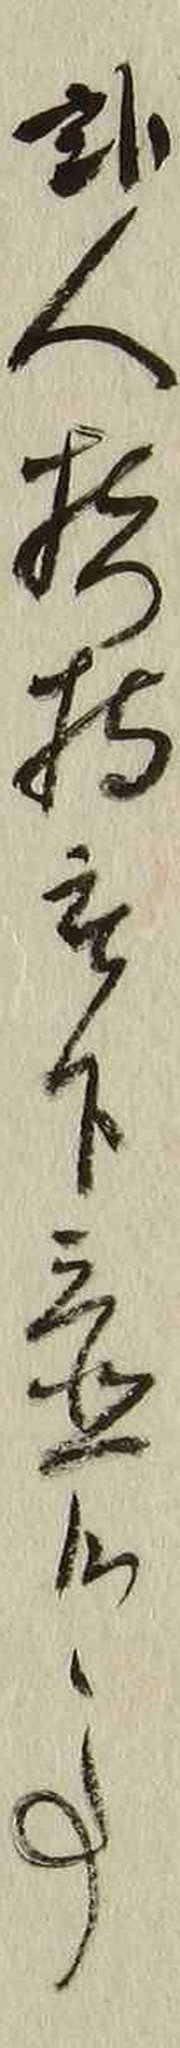弐人扶持被下置候事
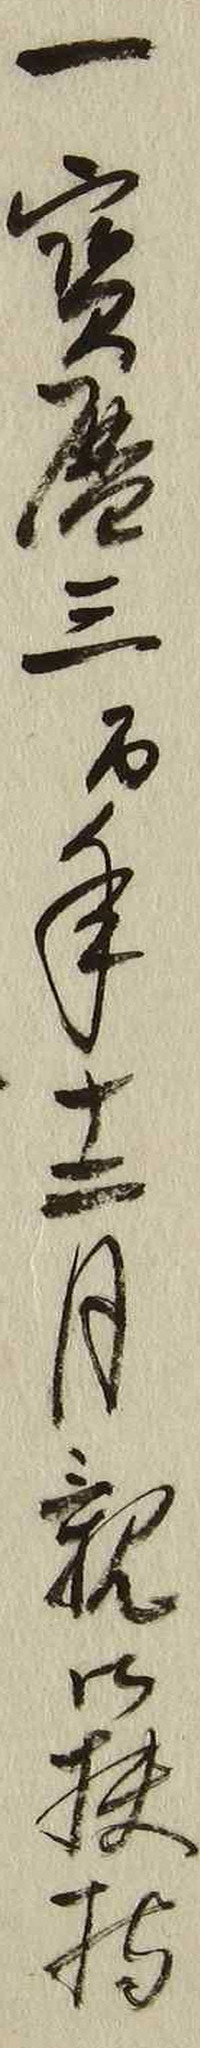一宝暦三酉年十二月親御扶持
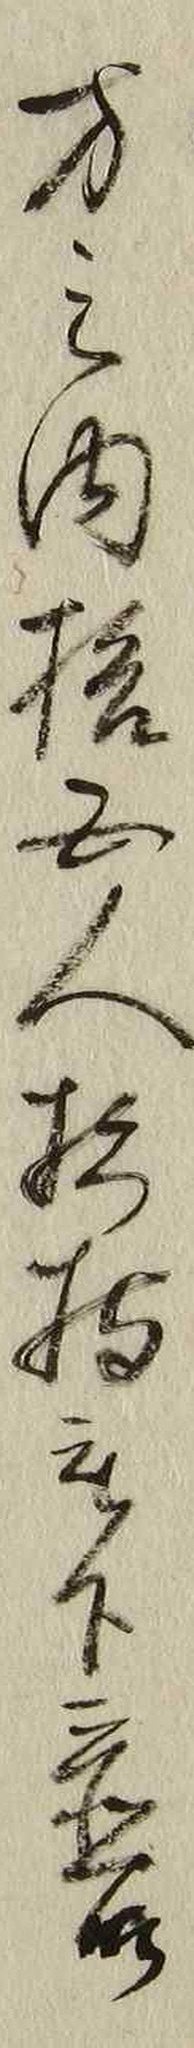方之内拾五人扶持被下置候
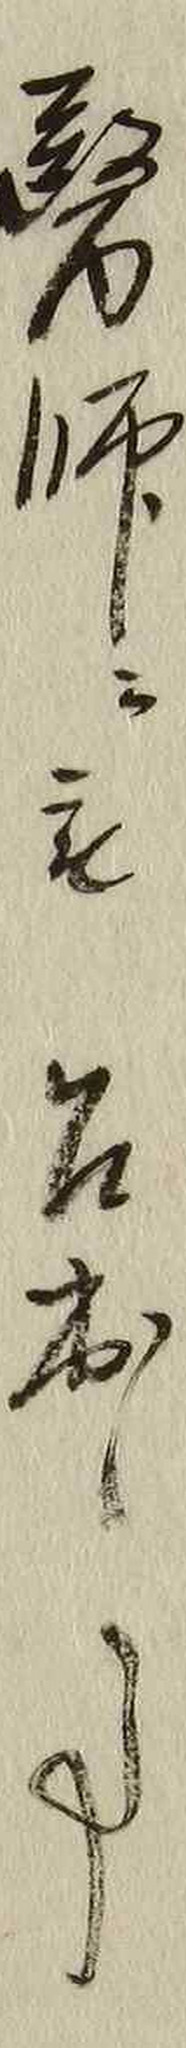医師ニ被召出候事
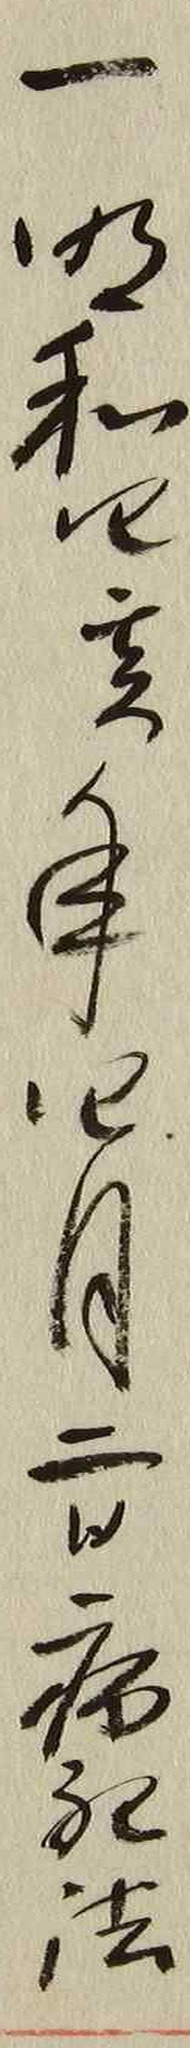一明和四亥年四月二日病死法
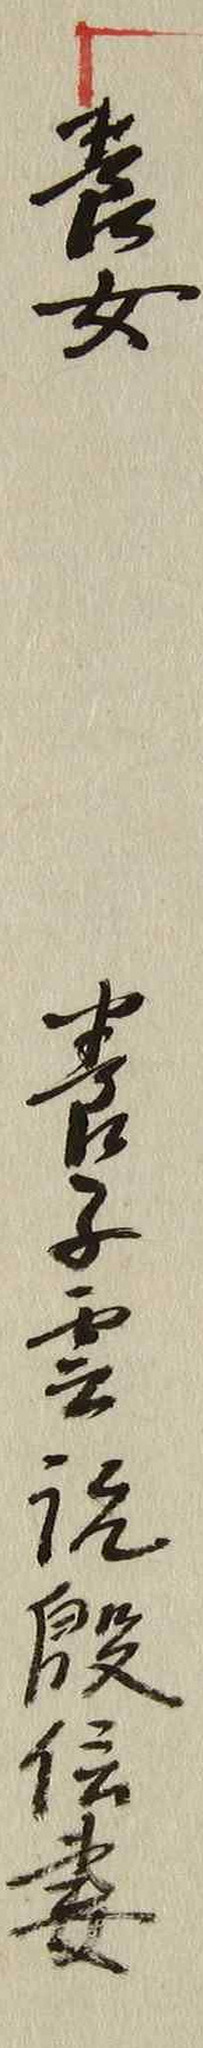養女養子雲説殷信妻
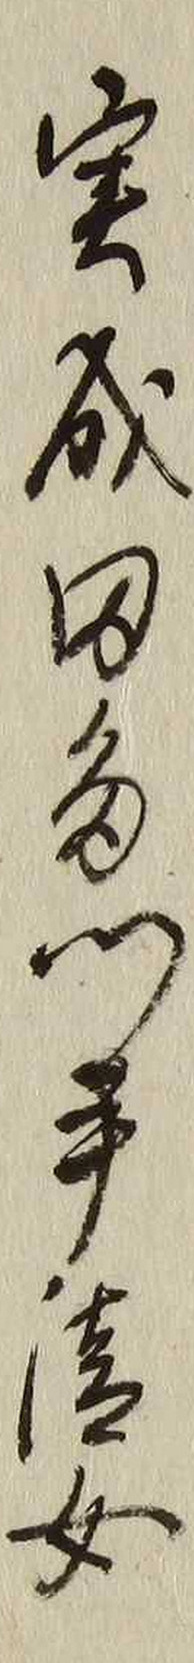実成田多門尹清女
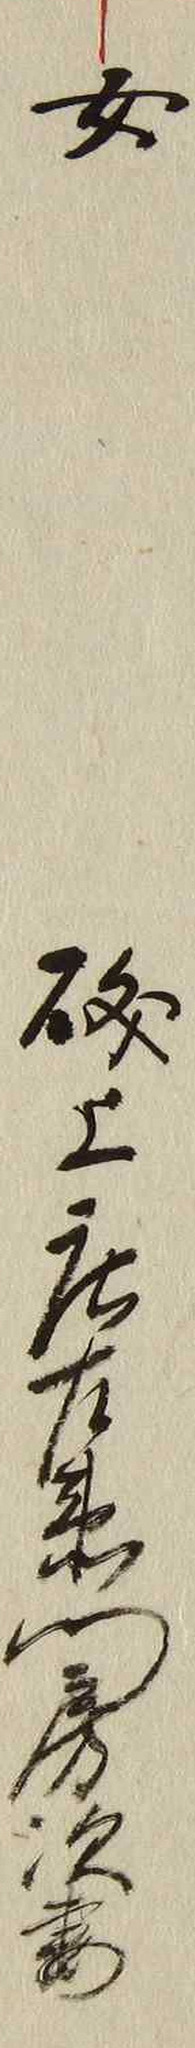女磯上庄左衛門房次妻
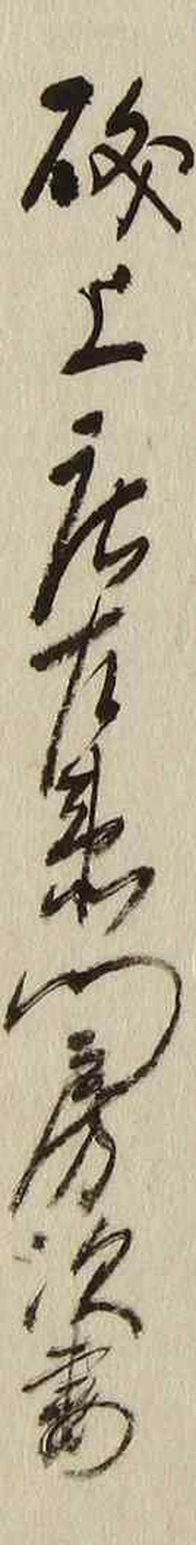女磯上庄左衛門房次妻
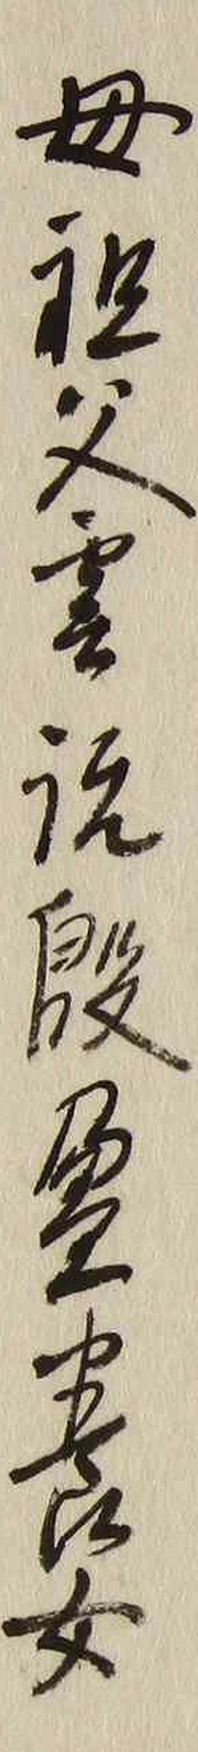母祖父雲説殷盈養女
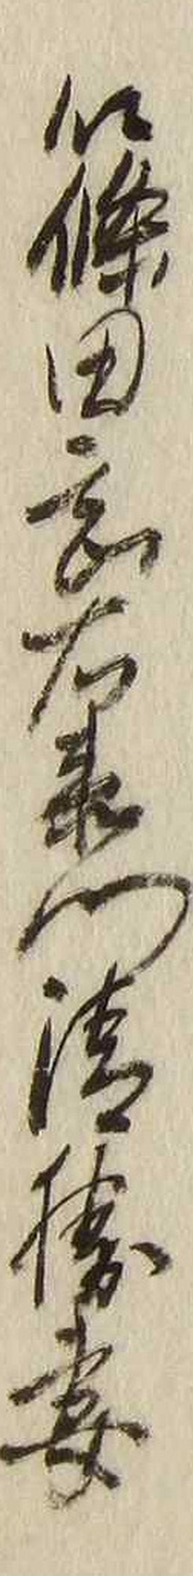女篠田甚右衛門清勝妻

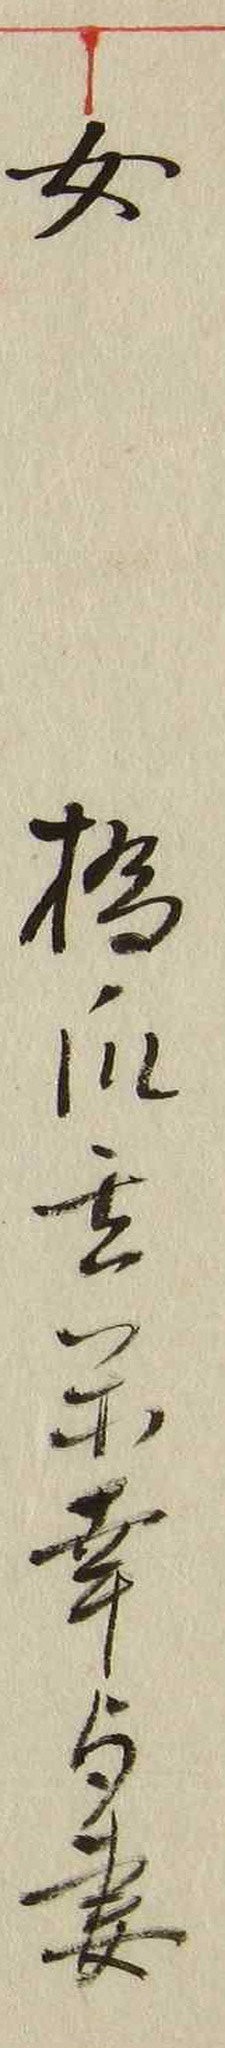女橋瓜玄閑幸与妻
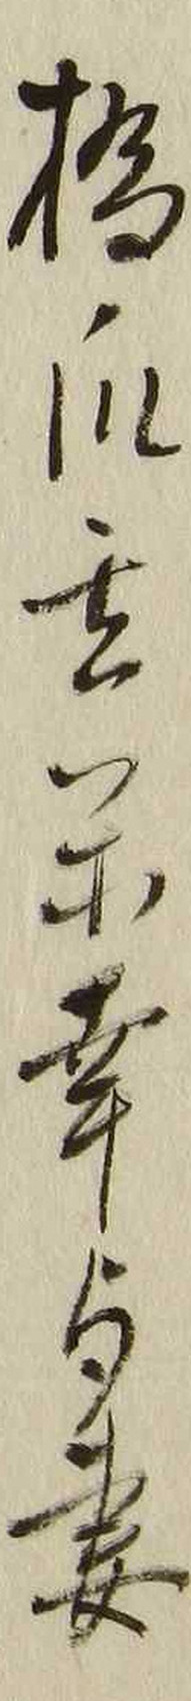女橋瓜玄閑幸与妻
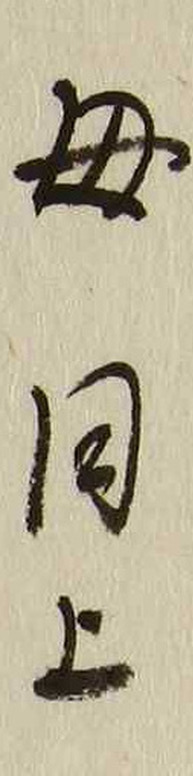母同上
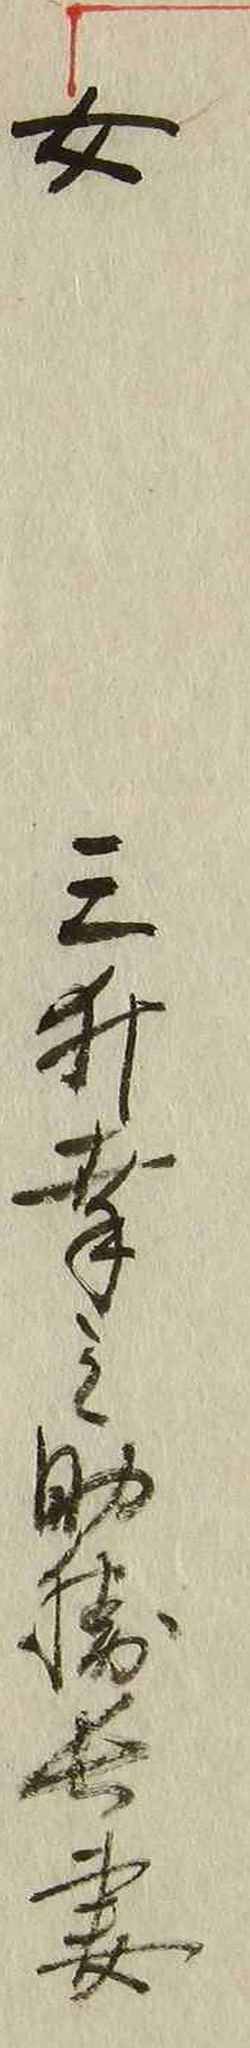女三井幸之助勝長妻
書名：諸士系譜　巻之353　す之部3
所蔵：会津若松市立会津図書館
